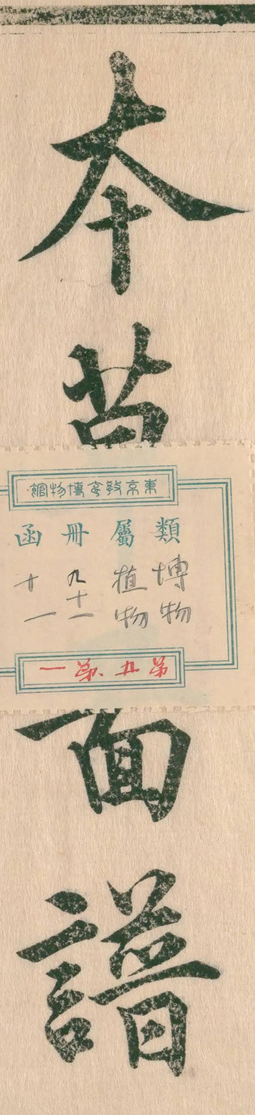本草面譜
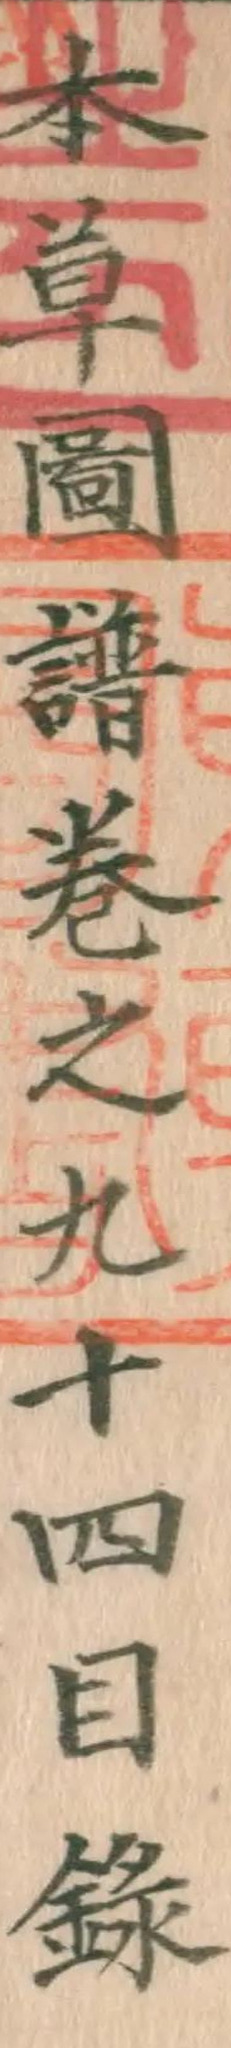本草図譜巻之九十四目録
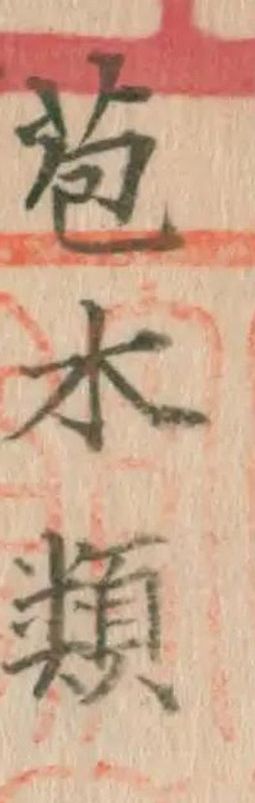苞木類
